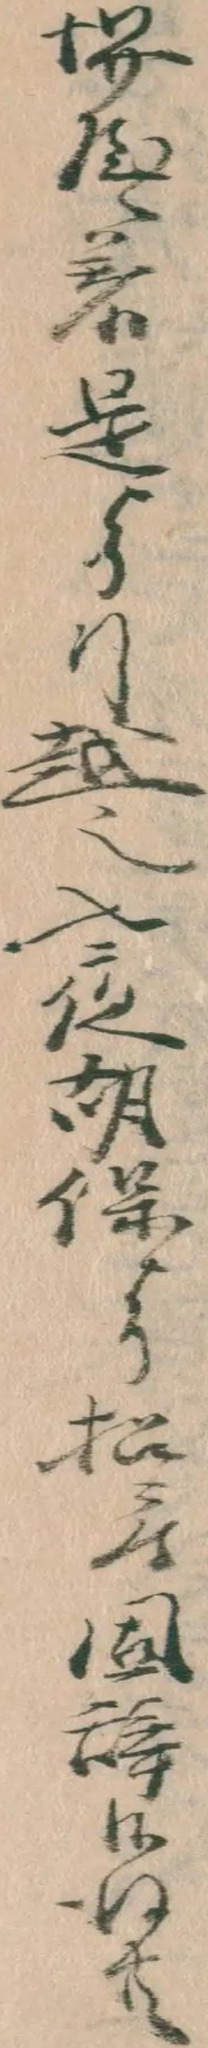堺屋へ着是より引越也入夜胡保より招ニ付固辞候得共
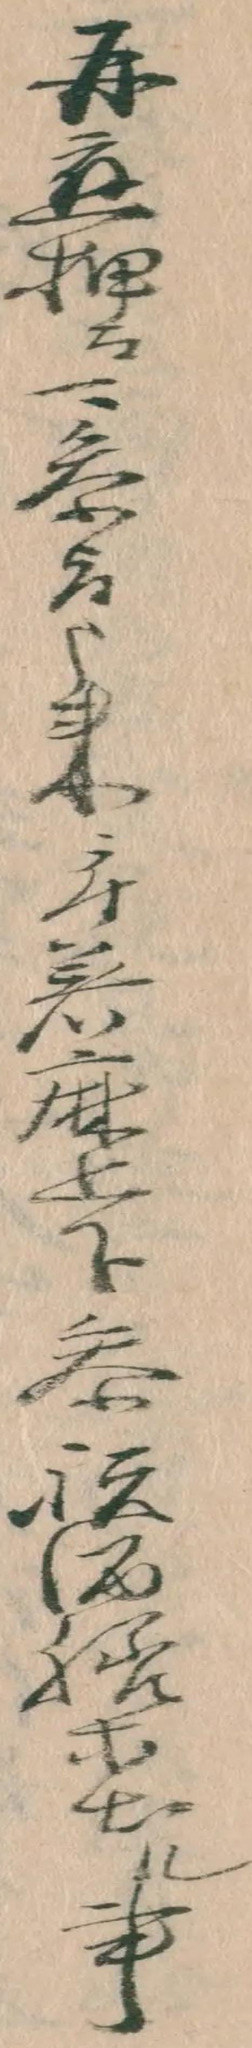再應押而可参旨申来ニ付着麻上下参祝酒膳等出ル事
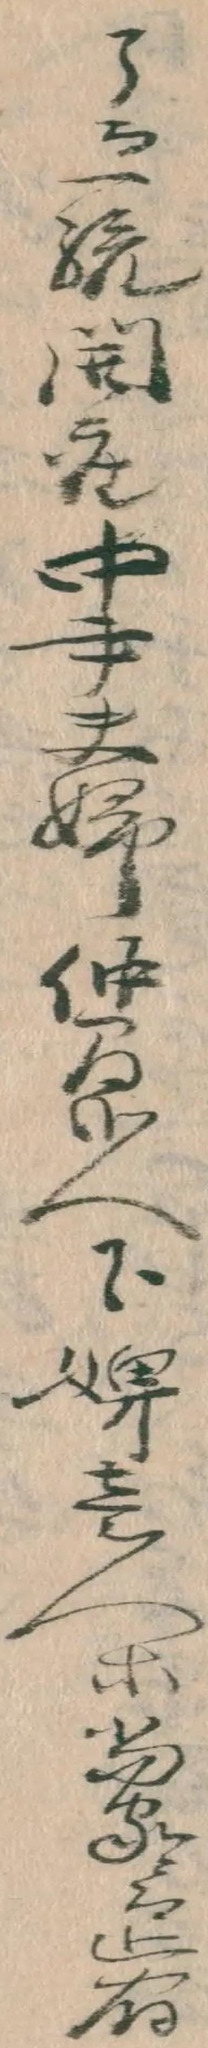了而一統開座中夫婦仲間弐人下婢壱人等當家ニ而止有
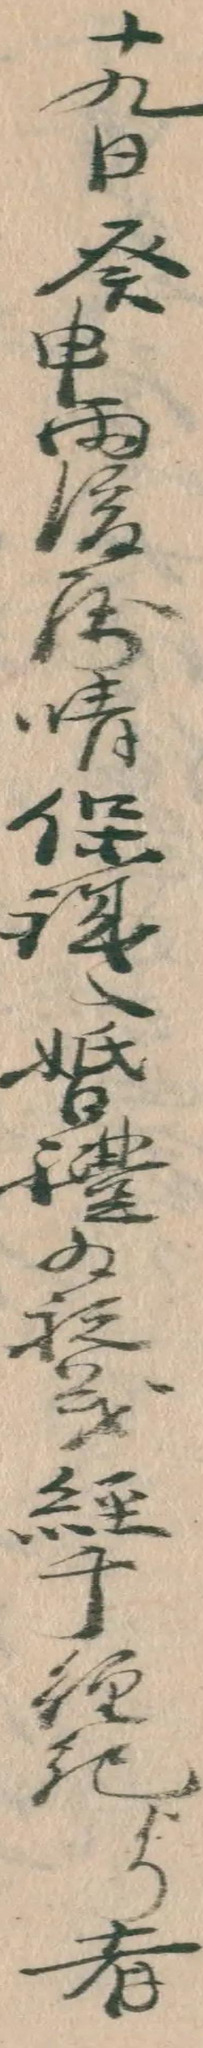十九日癸申雨後属晴保誠へ婚禮為祝義経千経紀より肴
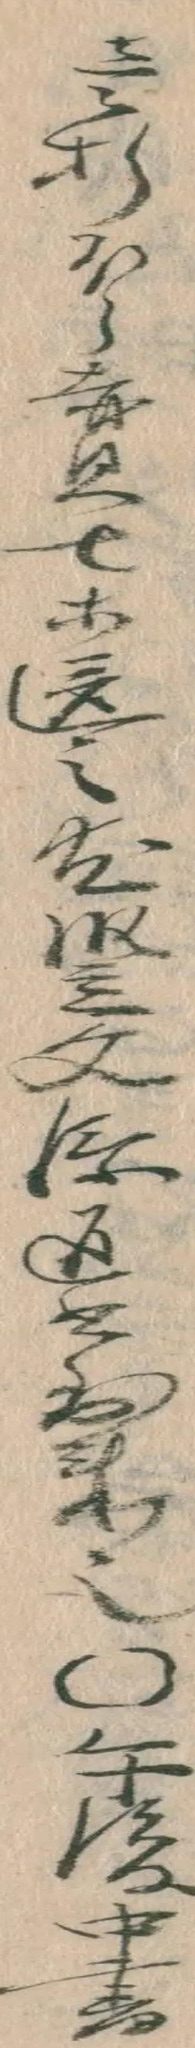壱折ほら赤貝七等送之尤堅文添返書到来也○午後中書
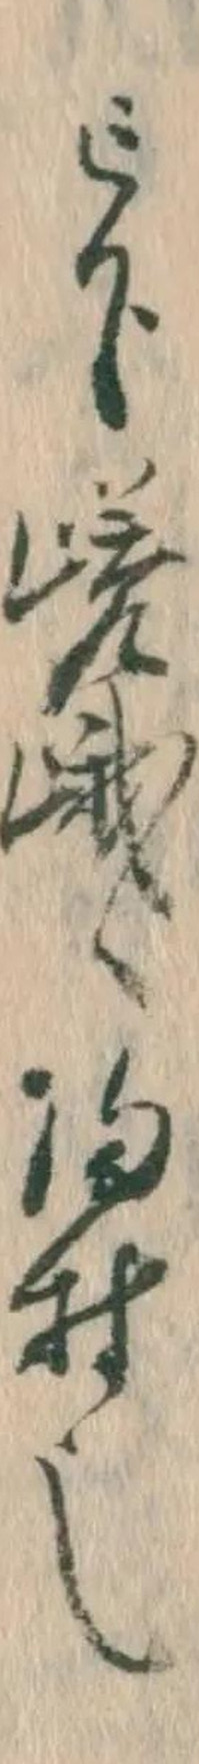被下嵯峨へ帰村也
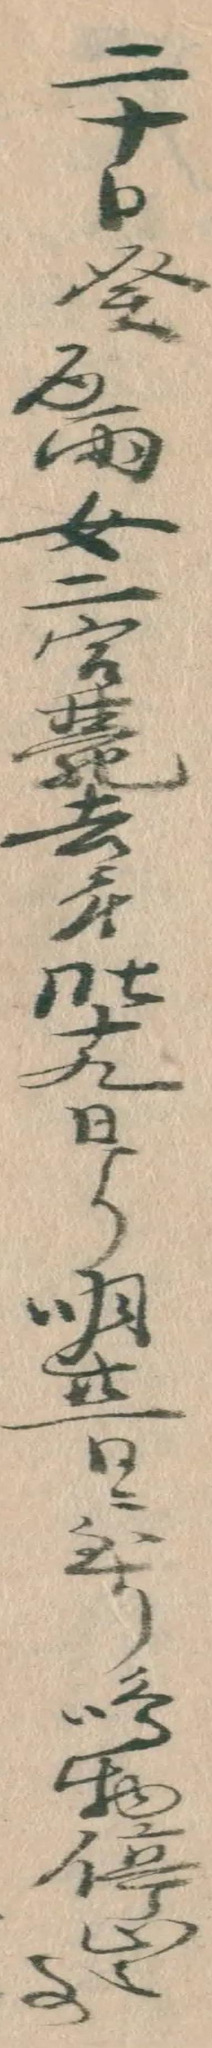二十日癸酉雨女二宮薨去二付昨十九日より明廿一日二至り鳴物停止之事
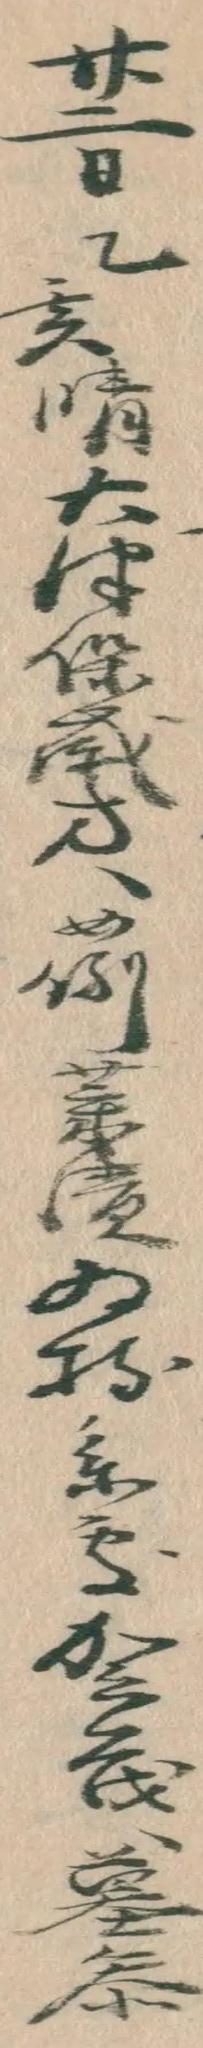廿二日乙亥晴大津保蔵方へ如例菜漬為持参處賀茂へ墓参
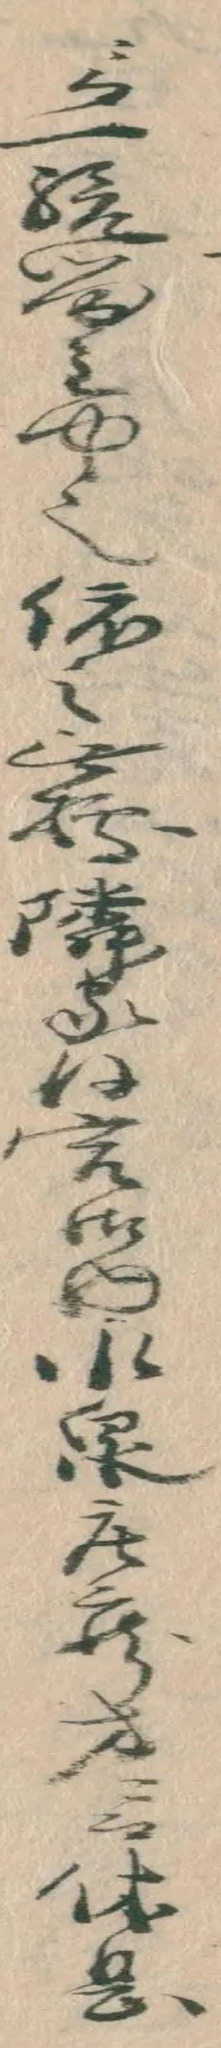ニ而一統留主中也依之無拠隣家向宮御内小泉庄蔵方ニ而休息
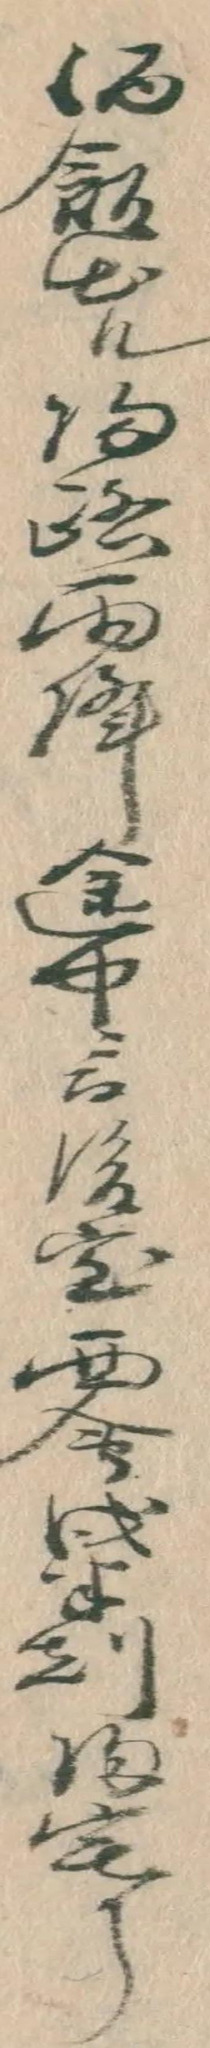酒飯出ル帰路雨降途中ニ而後宝西會戌半刻帰宅
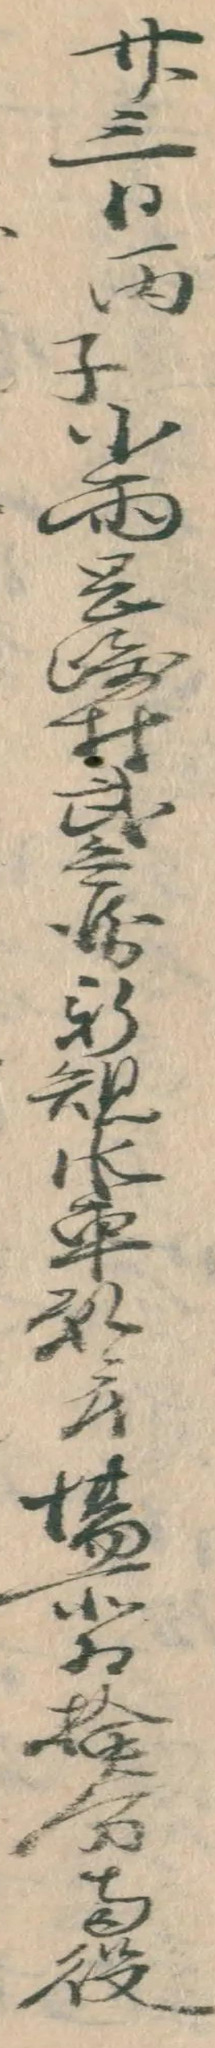廿三日丙子小雨岡崎村武兵衛新規水車願に付場所為検分両役
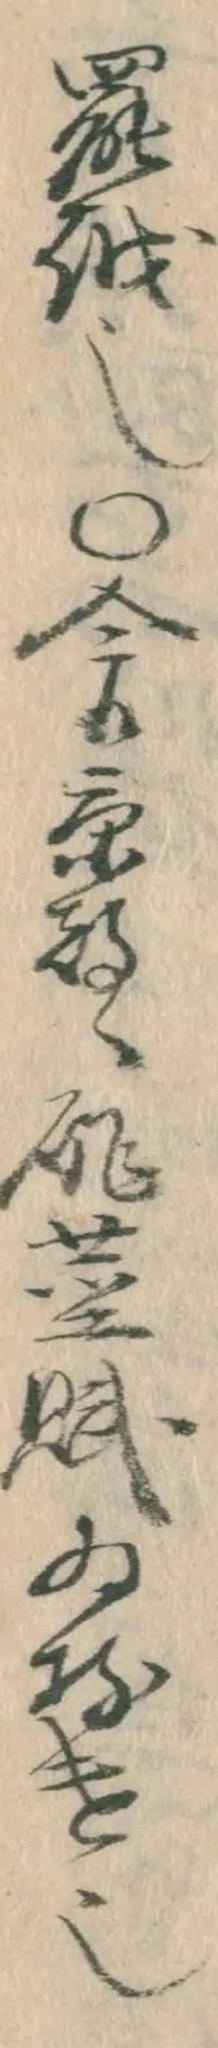罷越也○今日京都へ桃茎賦為持遣也

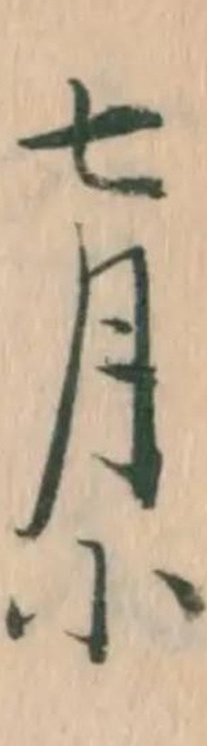七月小
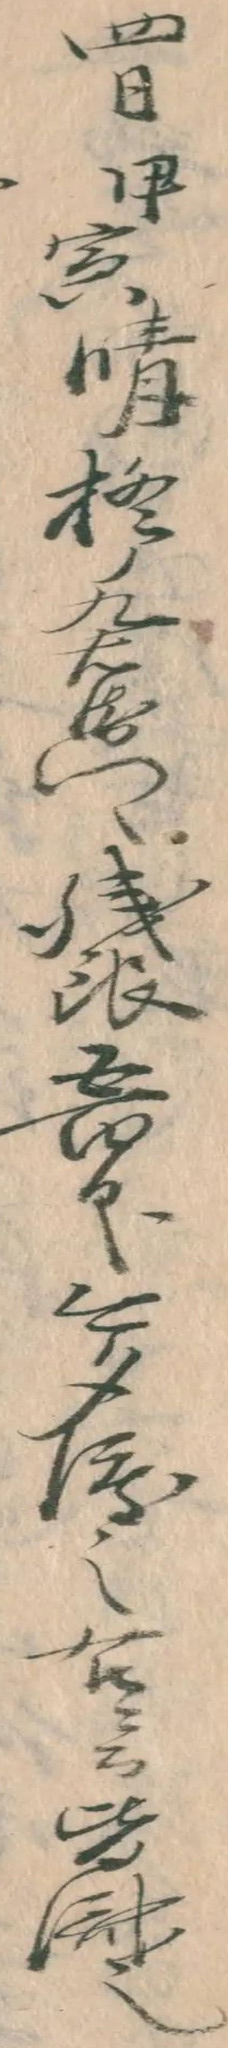四日甲寅晴柊ノ九右衛門へ残銀五百匁今夕渡之右ニ而皆済之
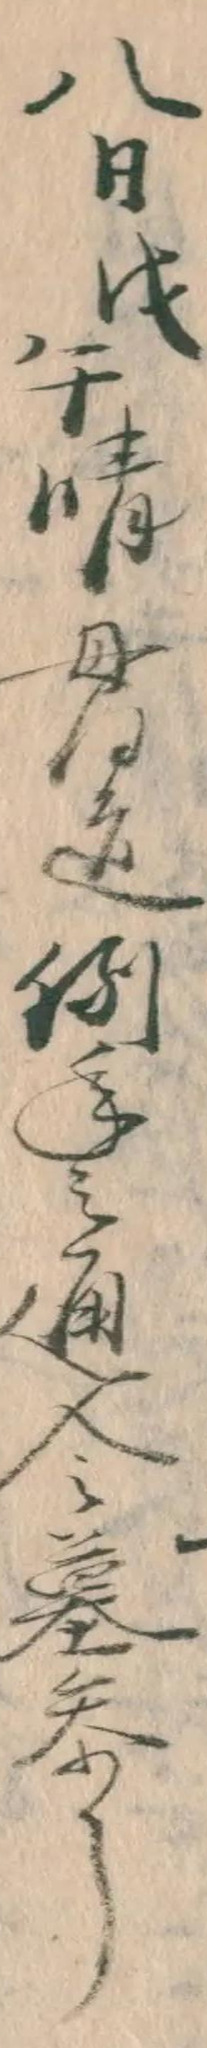八日戊午晴母同道例年之通令墓参了
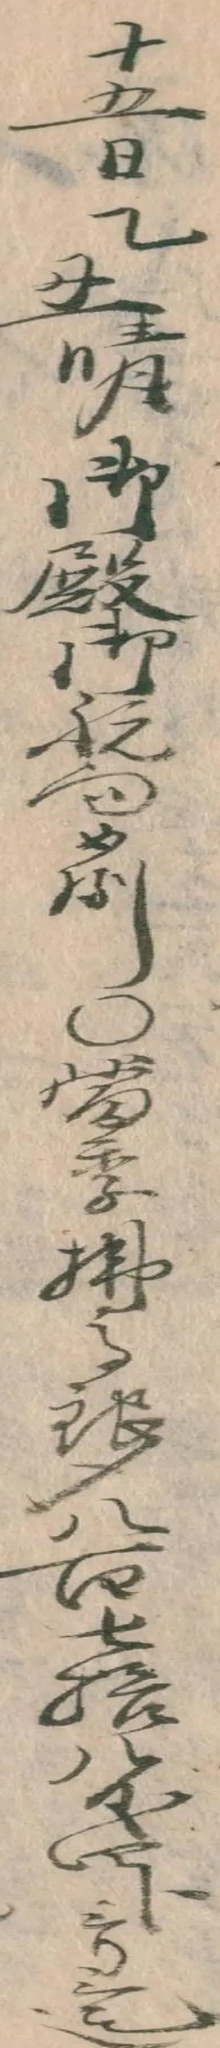十五日乙丑晴御殿御祝向如例〇當季払高銀〆八百七拾八匁四分三厘迄也
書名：賀茂社記録. 第66冊
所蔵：国立国会図書館 National Diet Library, JAPAN
